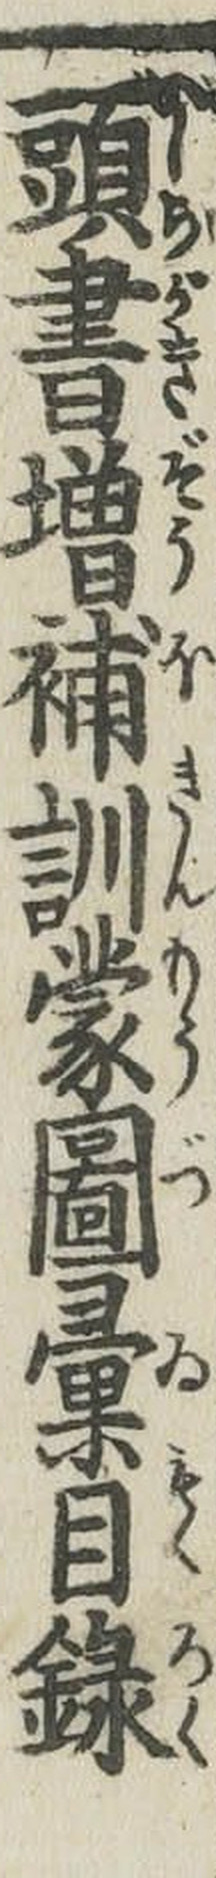頭書増補訓蒙図彙目録
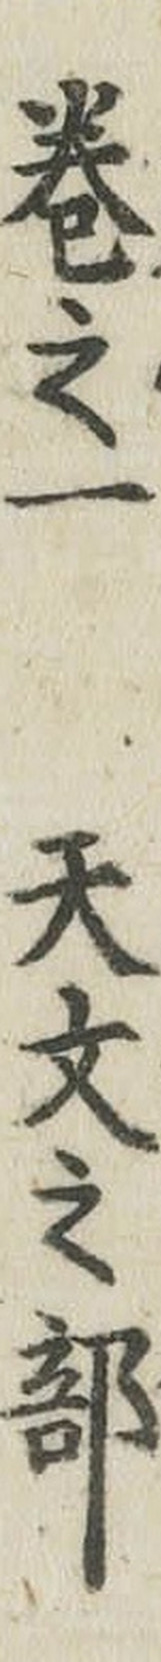巻之一天文之部

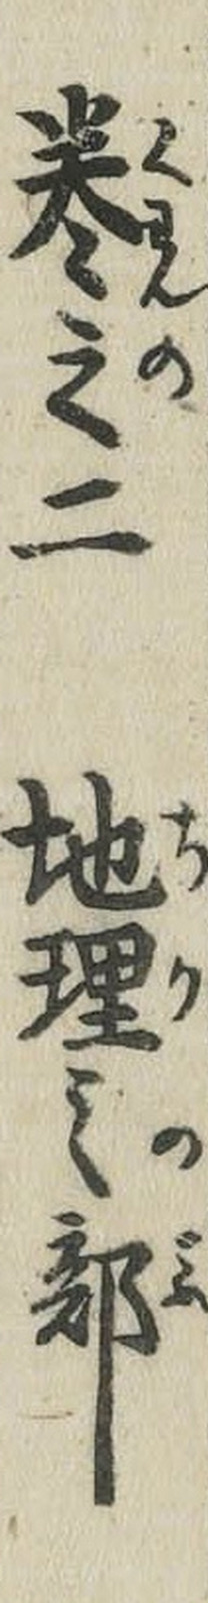巻之二地理之部
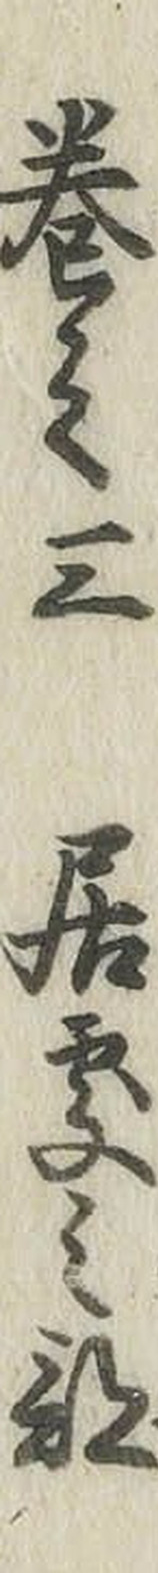巻之三居処之部

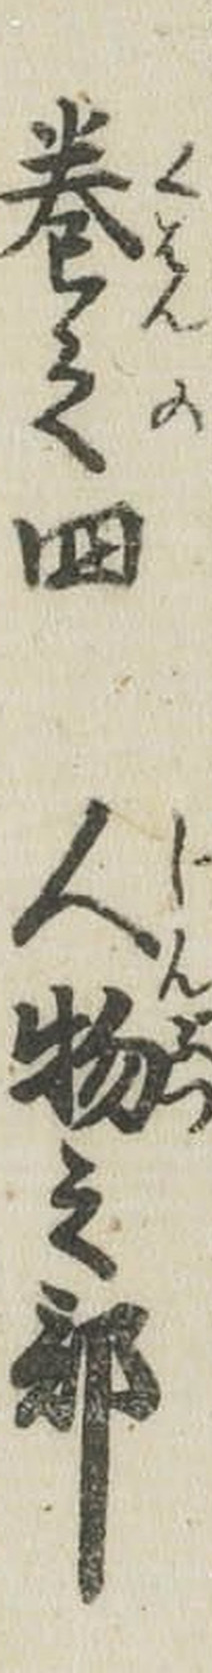巻之四人物之部

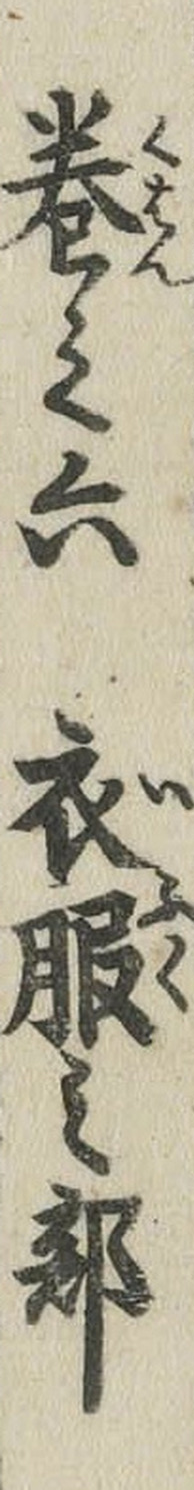巻之六衣服之部
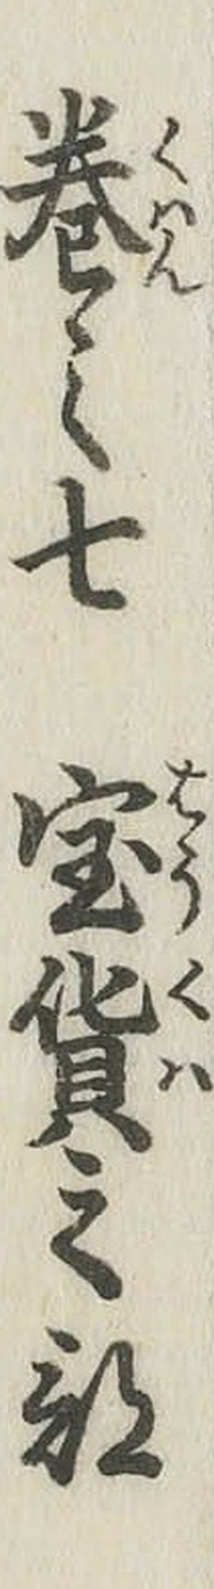巻之七宝貨之部

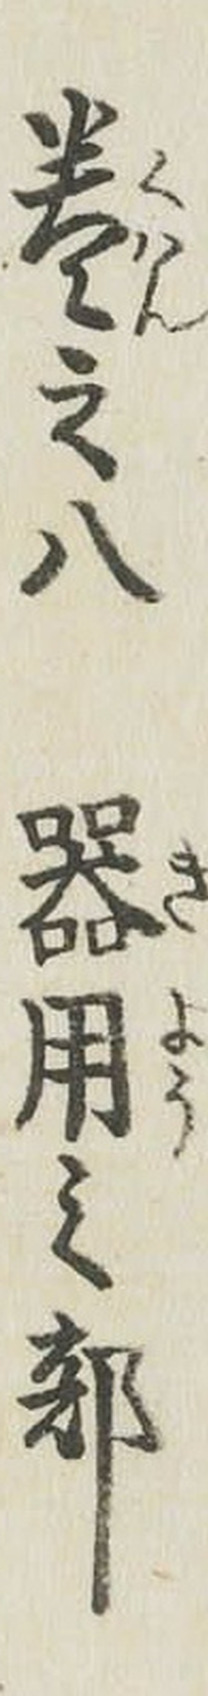巻之八器用之部

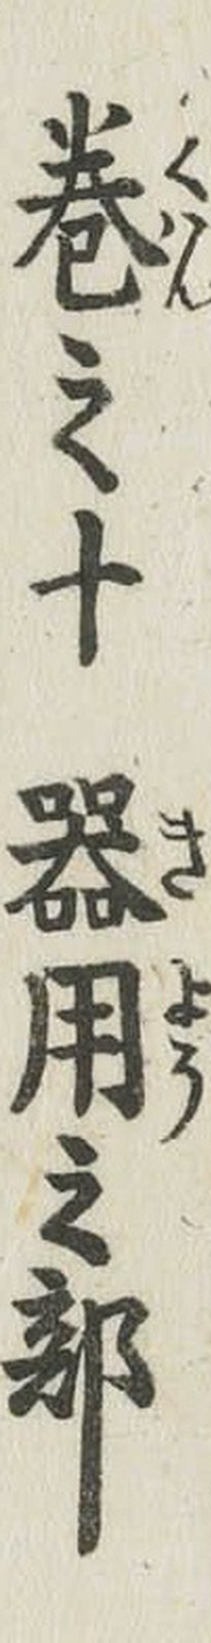巻之十器用之部

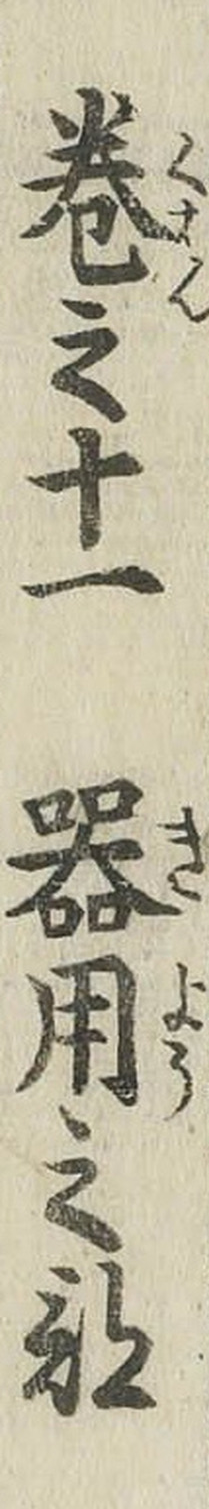巻之十一器用之部

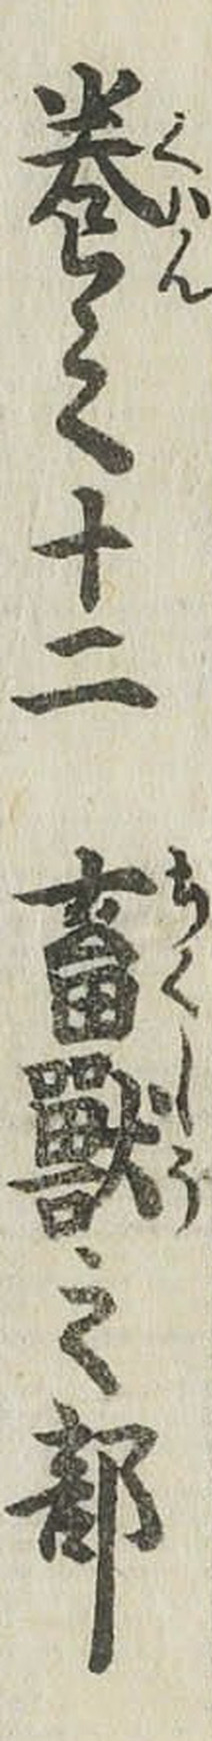巻之十二畜獣之部

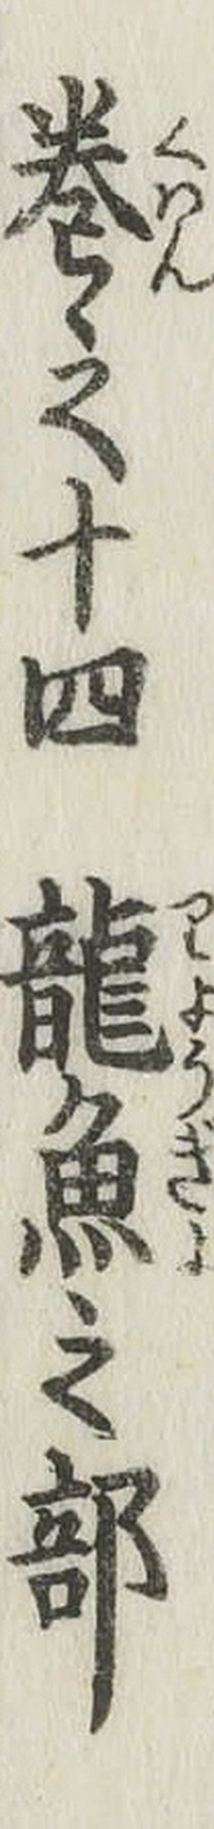巻之十四竜魚之部

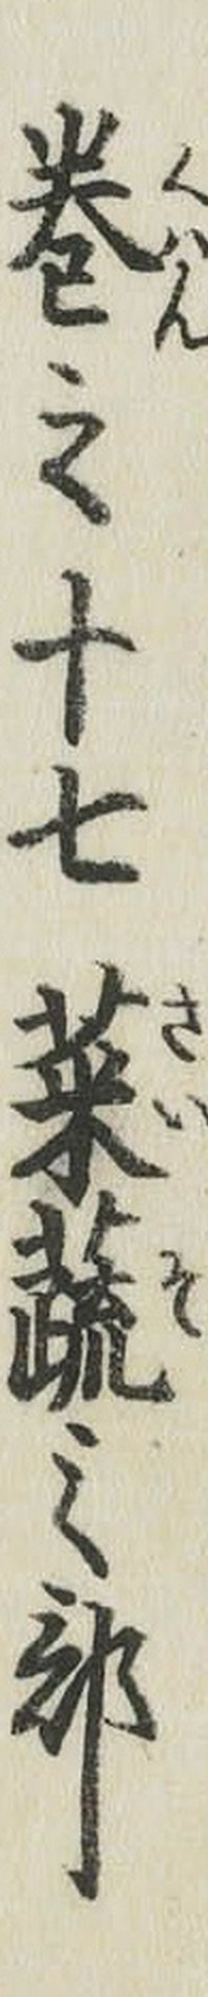巻之十七菜蔬之部

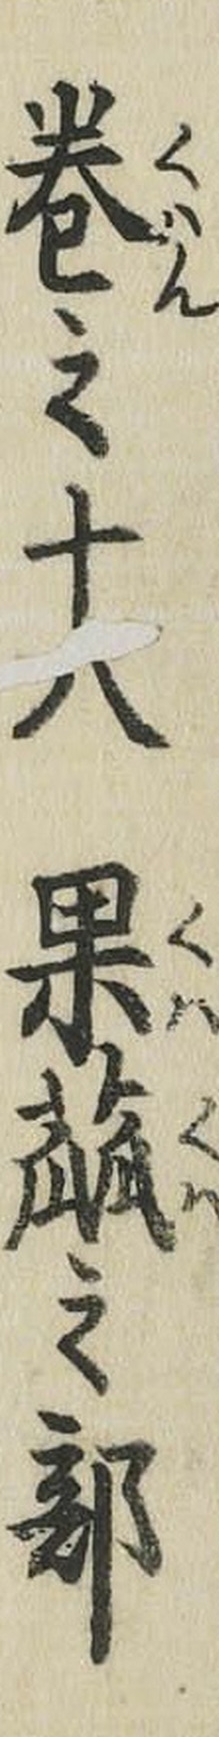巻之十八果蓏之部
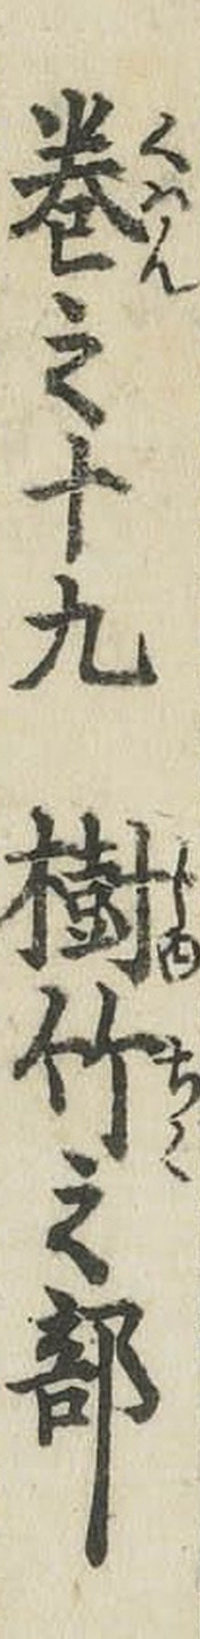巻之十九樹竹之部

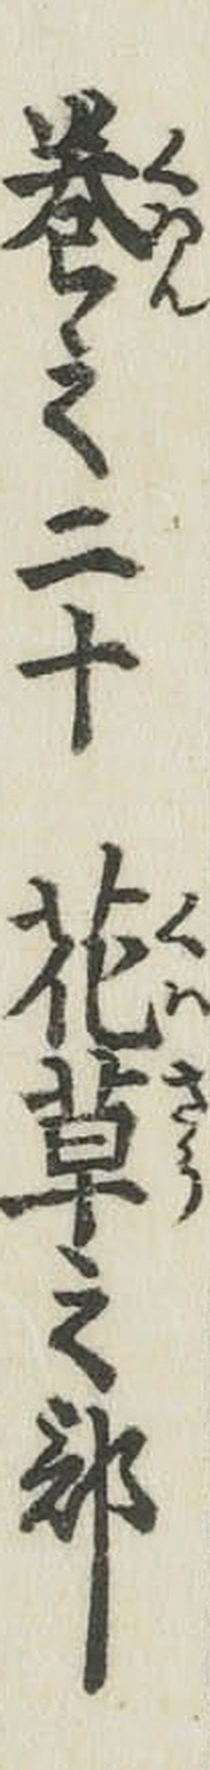巻之二十花草之部
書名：増補頭書訓蒙図彙大成 10巻 1:序, 凡例, 目録
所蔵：東京学芸大学教育コンテンツアーカイブ
